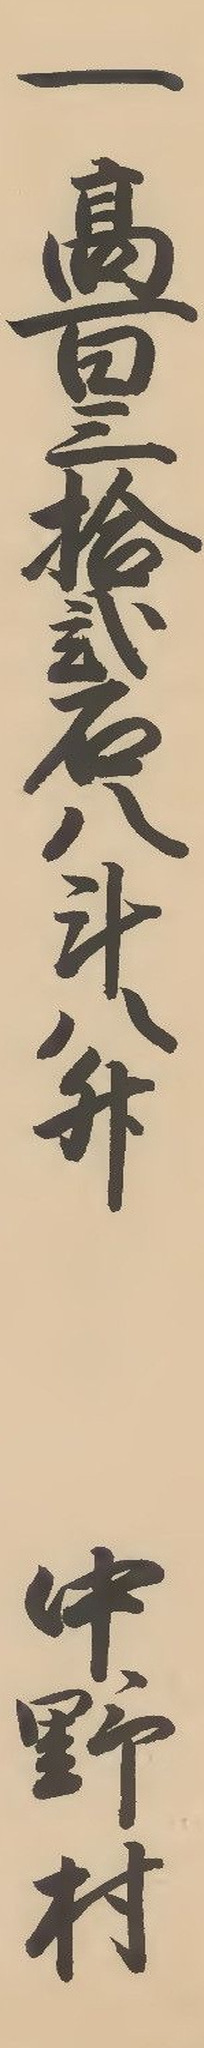一高百三拾弐石八斗八升中野村
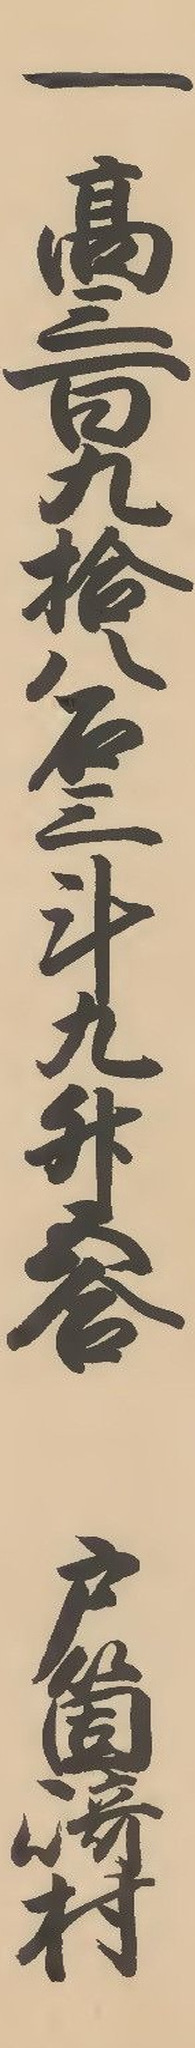一高三百九拾八石三斗九升五合戸箇崎村
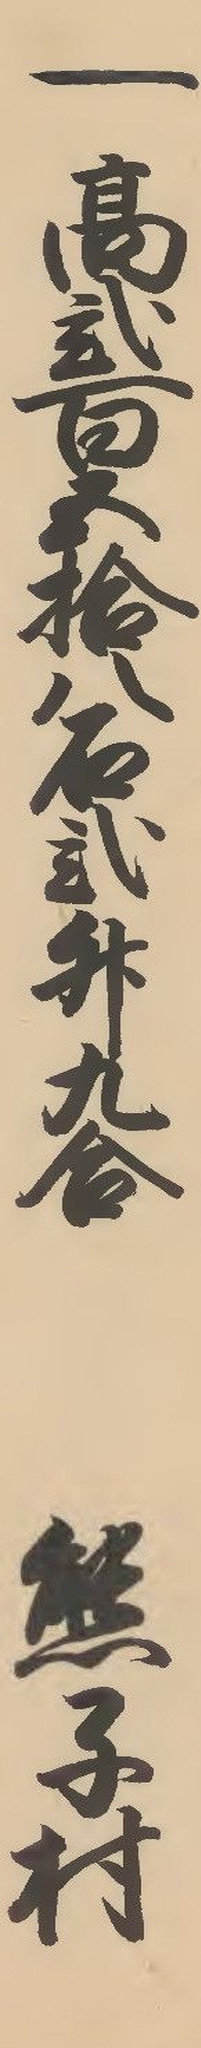一高弐百五拾八石弐升九合熊子村
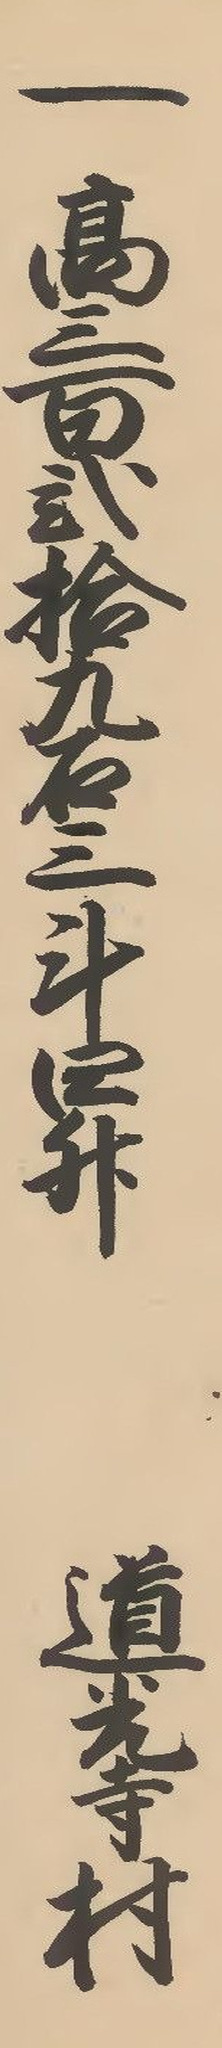一高三百弐拾九石三斗四升道光寺村
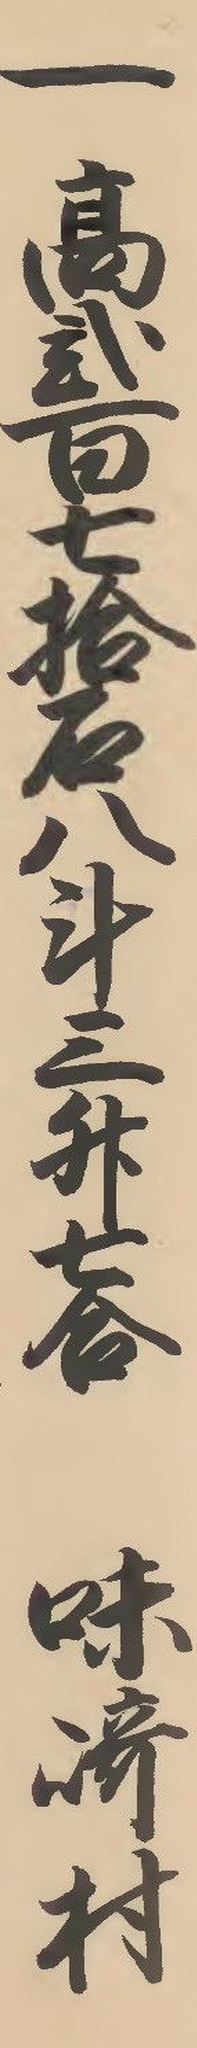一高弐百七拾石八斗三升七合味崎村
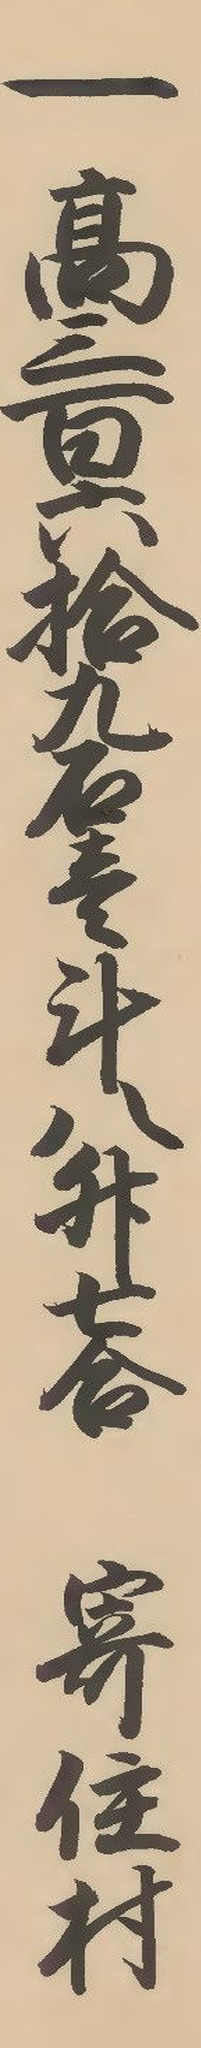一高三百六拾九石壱斗八升七合寄住村
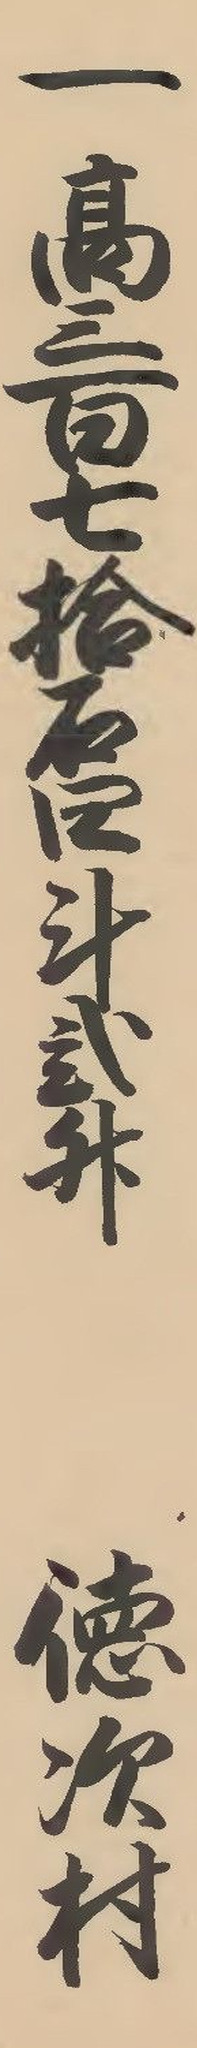一高三百七拾石四斗弐升徳次村
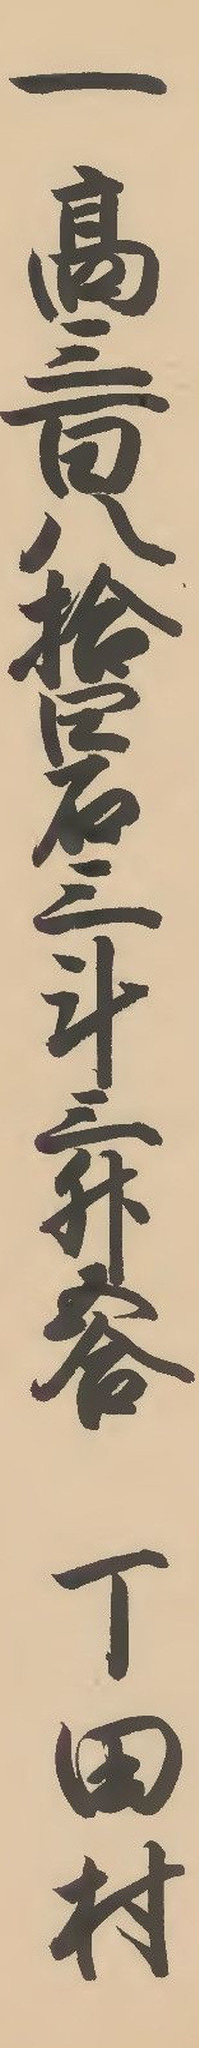一高三百八拾四石三斗三升五合丁田村

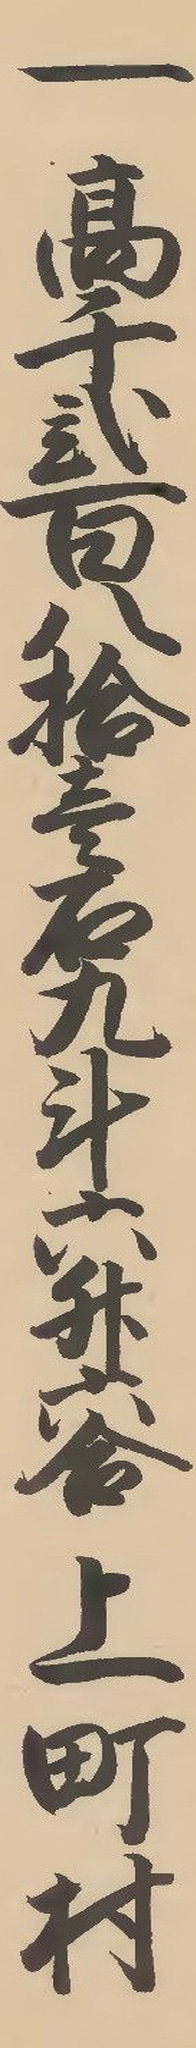一高千弐百八拾壱石九斗六升六合上町村
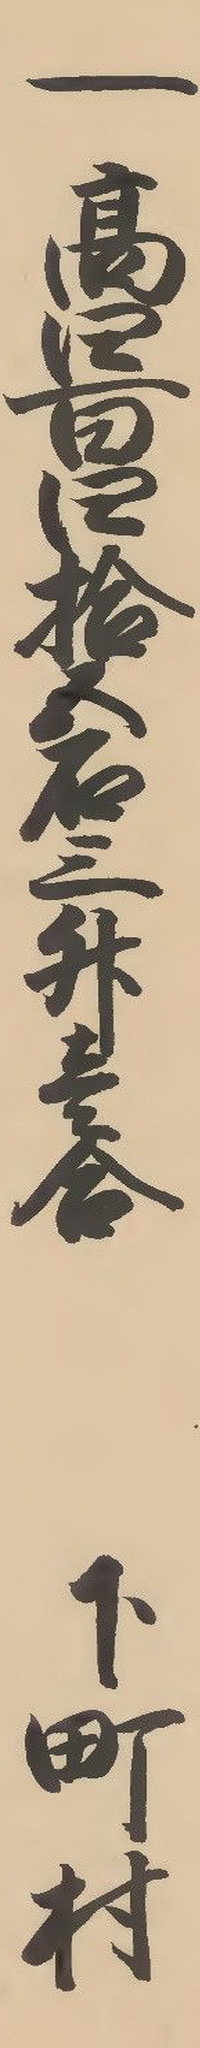一高四百四拾五石三升壱合下町村
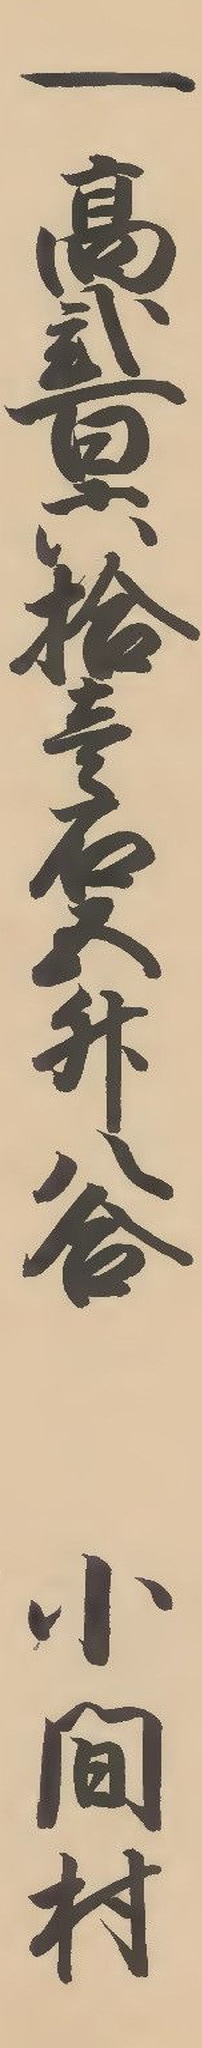一高弐百六拾壱石五升八合小間村
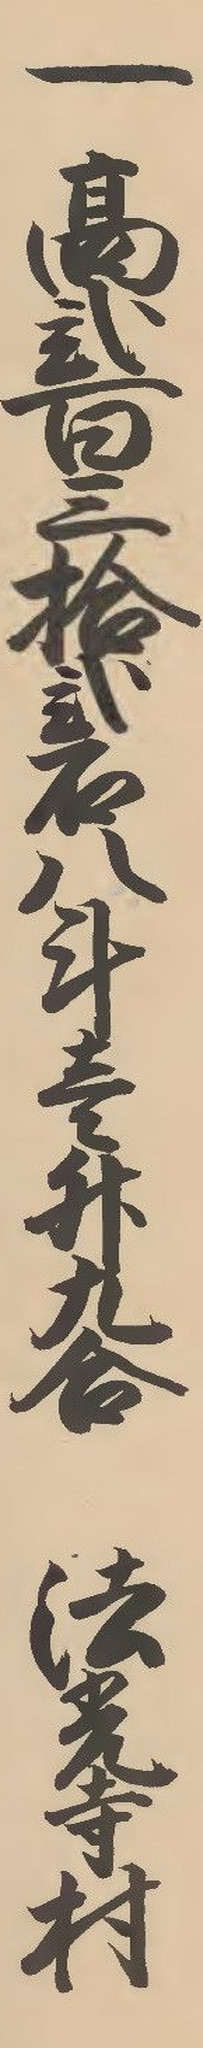一高弐百三拾弐石八斗壱升九合法光寺村
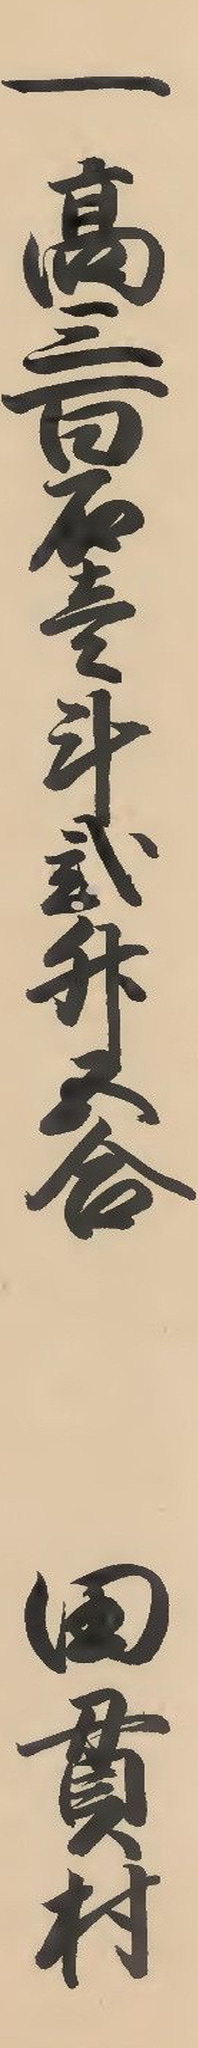一高三百石壱斗弐升五合田貫村
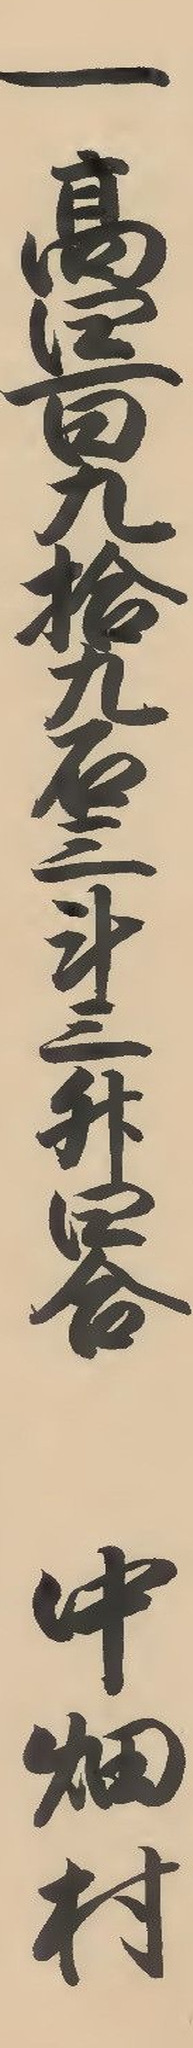一高四百九拾九石三斗三升四合中畑村
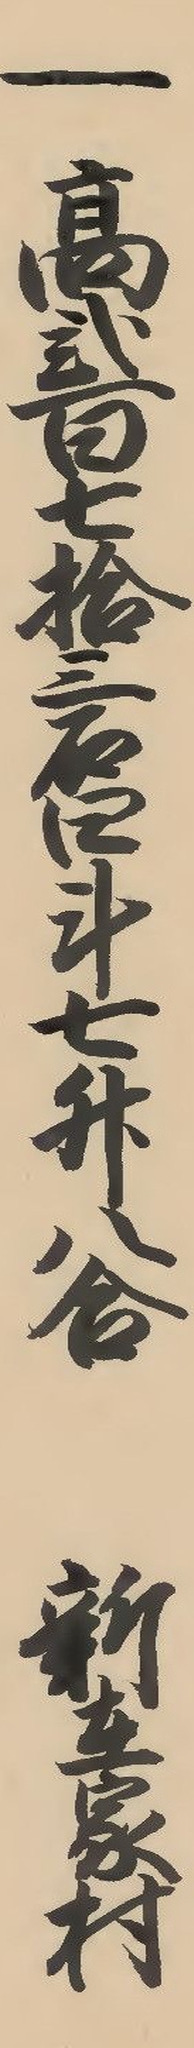一高弐百七拾三石四斗七升八合新在家村
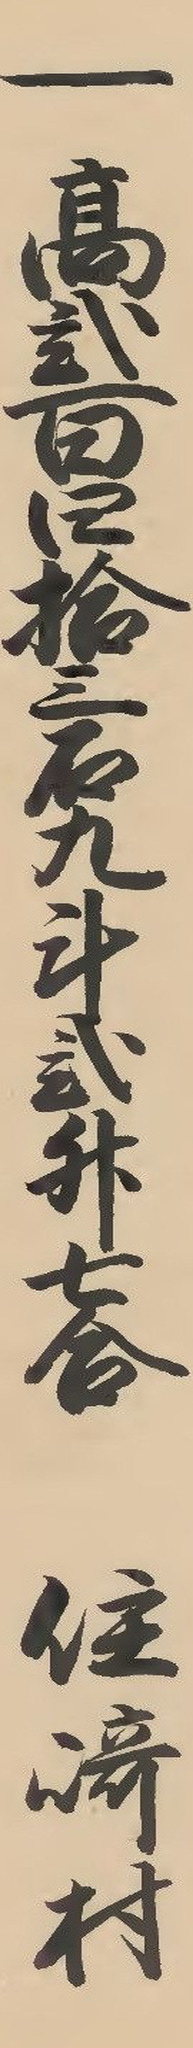一高弐百四拾三石九斗弐升七合住崎村
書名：三河国郷帳
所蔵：国立公文書館 National Archives of Japan
